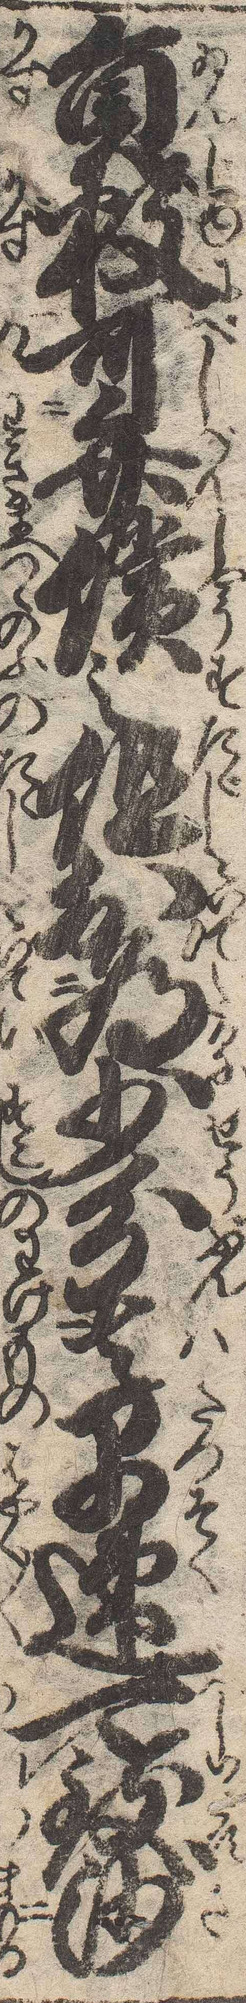員数可弁償之但於為少分者早速可致沙
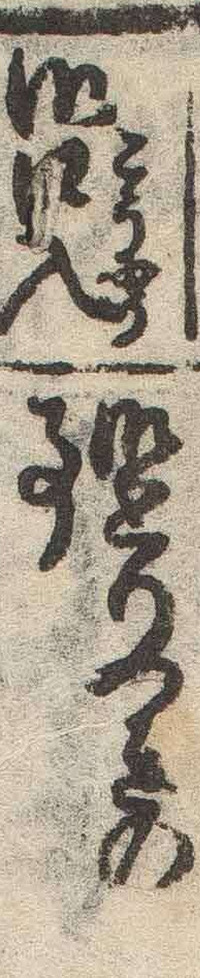御口入御とりつきの
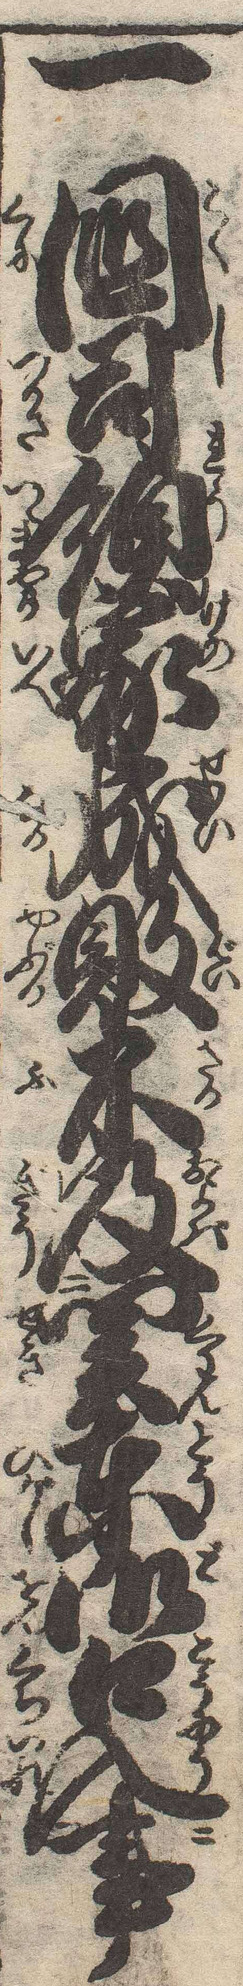一国司領家成敗不及関東御口入事
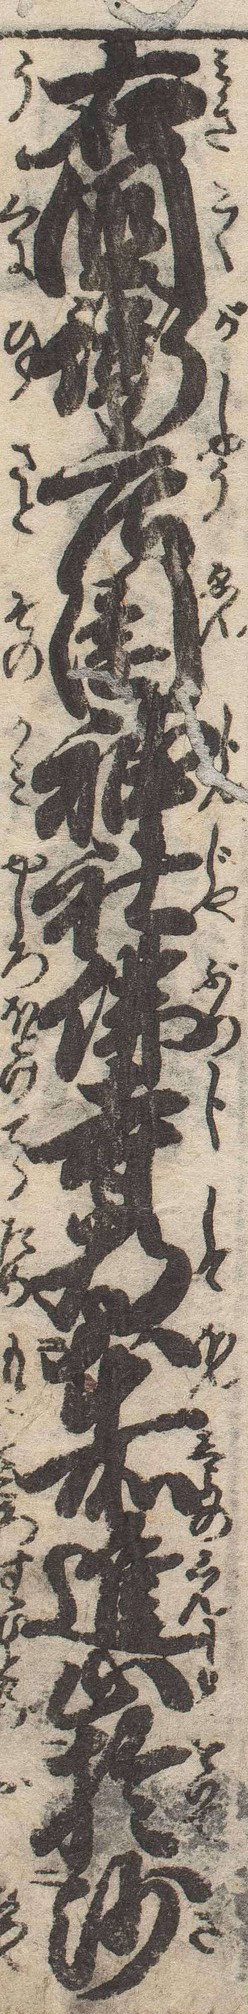右国衙庄園神社佛寺為本所進止於沙
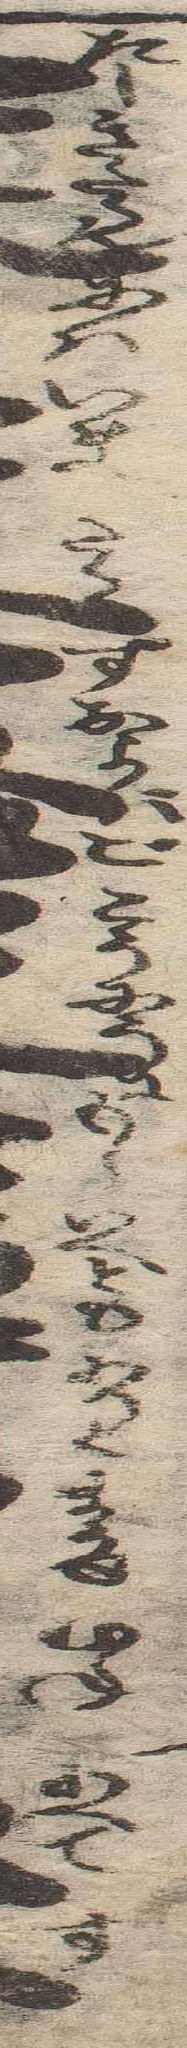たしきたらんにはいまさらずおよばごこうにうにもしいへともありとまうすむねあへてす

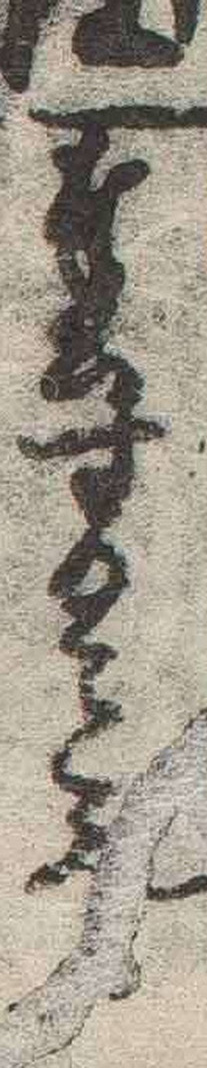官仕奉公すること也
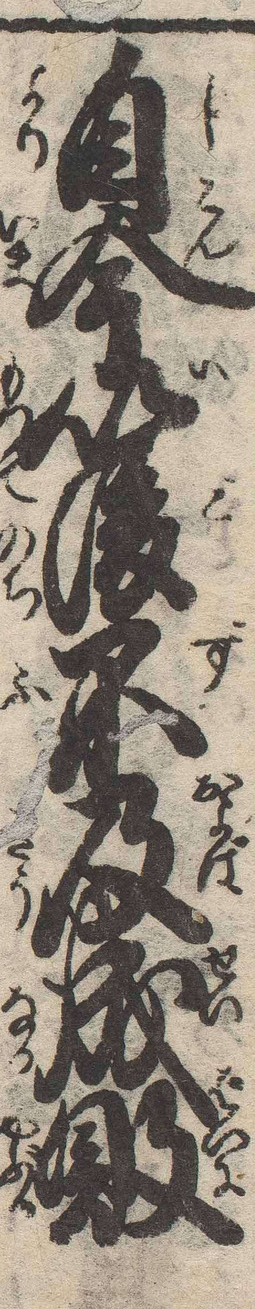自今以後不及成敗
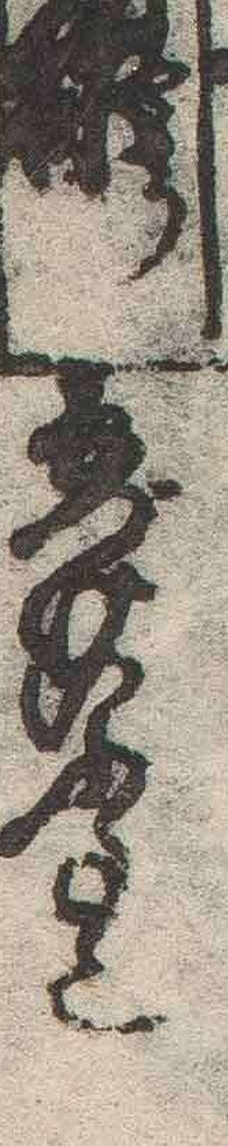称なづけいふ事也
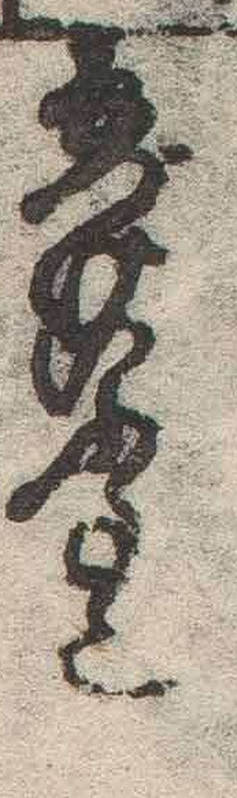称なづけいふ事也
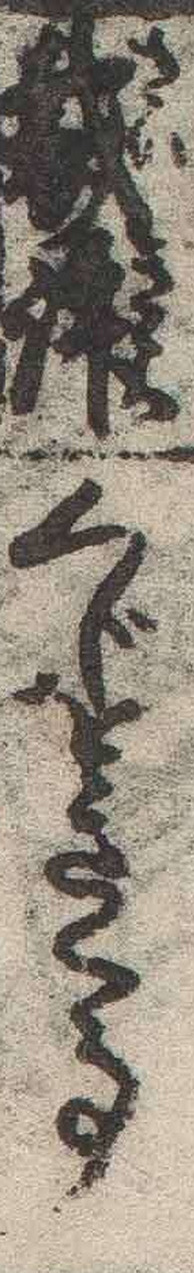裁許くじをきく事
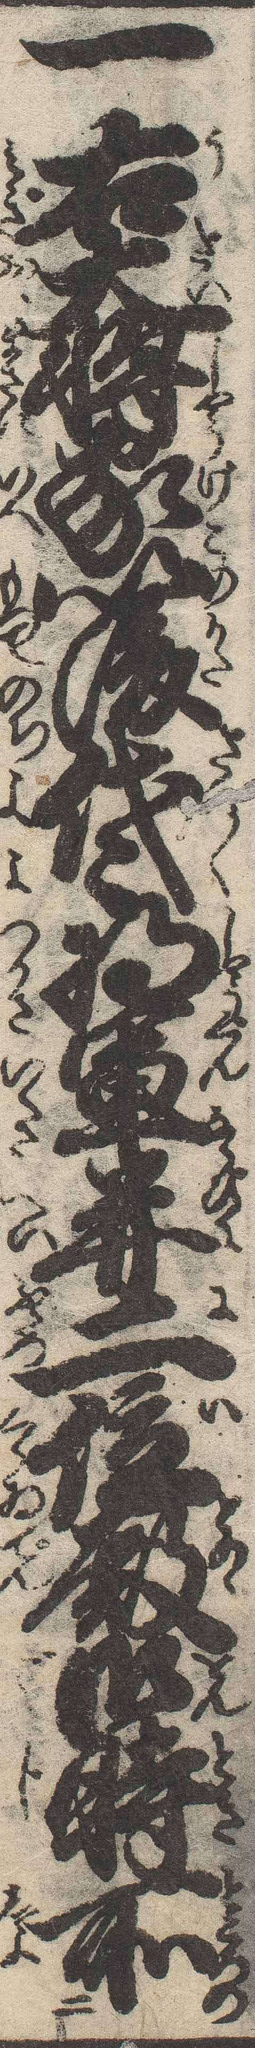一右大将家以後代々将軍幷二位殿御時所
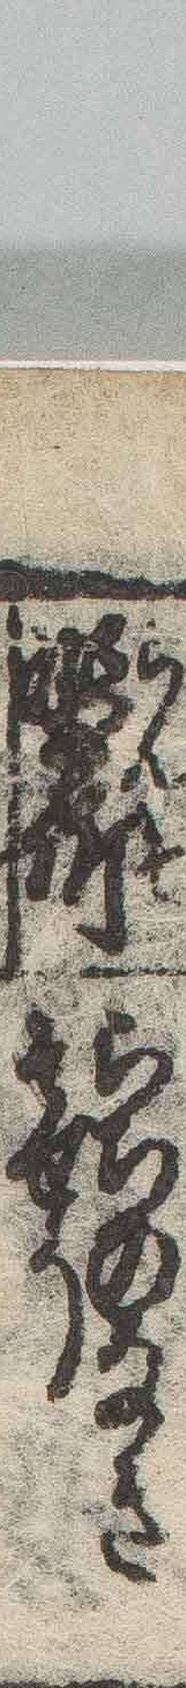濫訴らちのなき
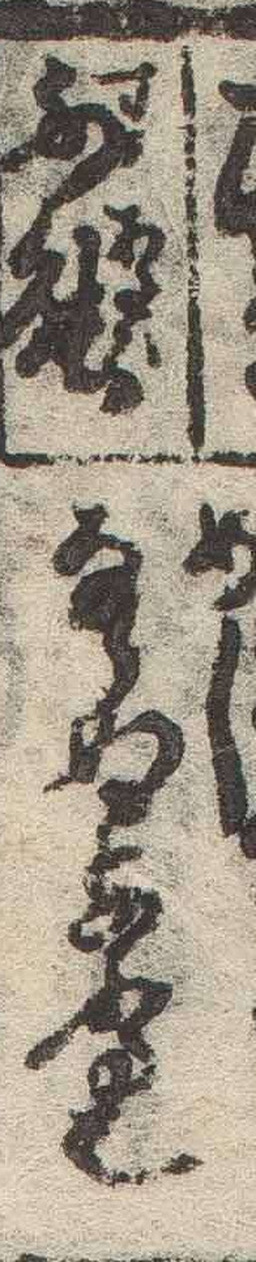不能ならぬといふ事也
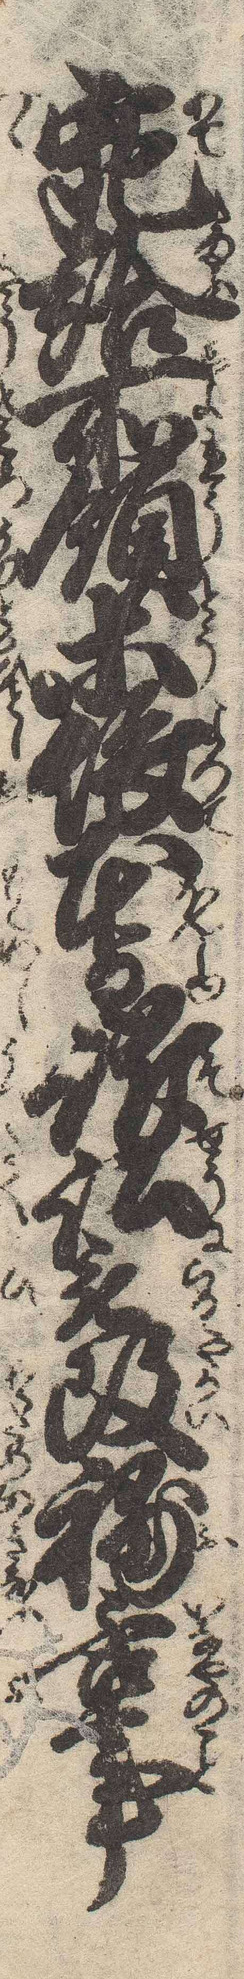宛給所領等依本主訴訟被改補否事
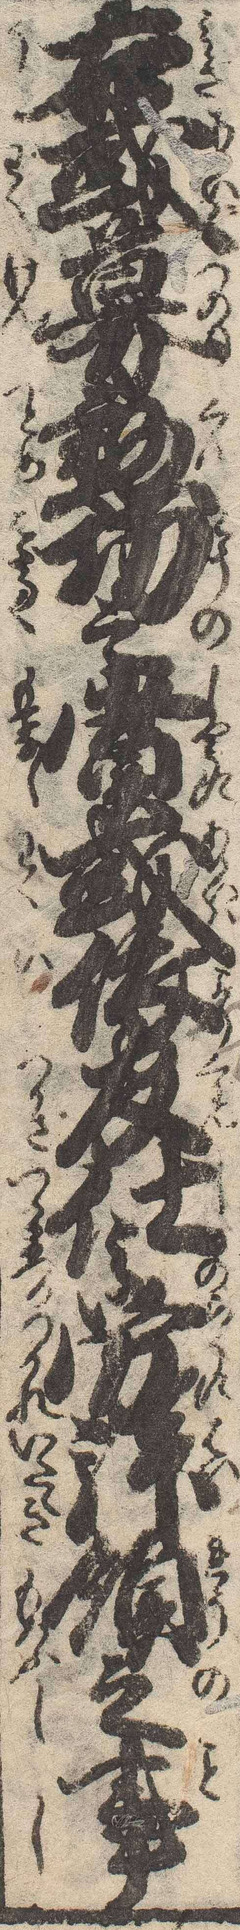右或募勲功之賞或依官仕之労拝領之事
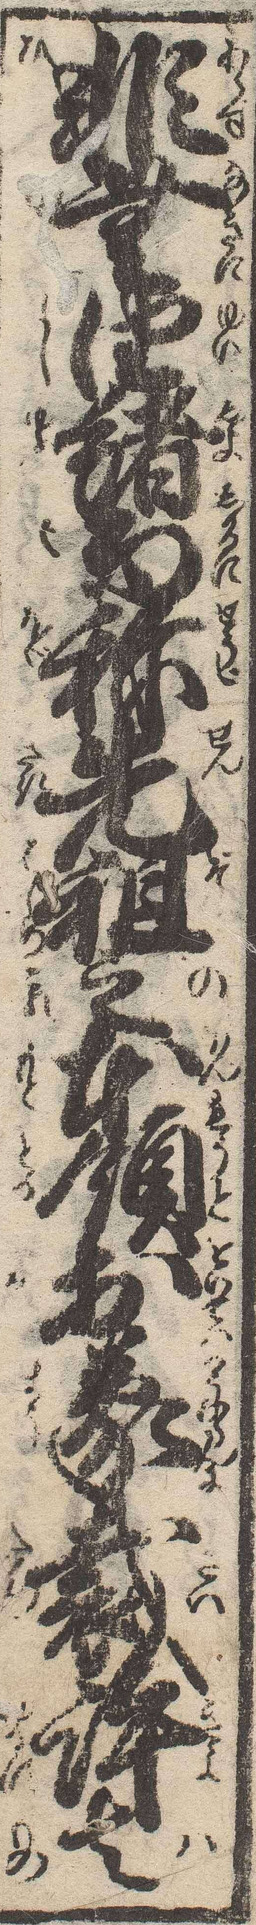非無由緒而称先祖之本領於蒙裁許者
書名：御成敗式目絵抄
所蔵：東京学芸大学附属図書館 国文学研究資料館
